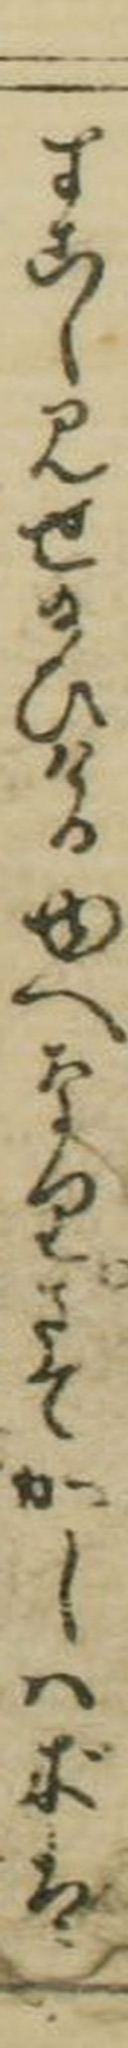すこし見せ給ひけるゆへなり。さてかしはぎは
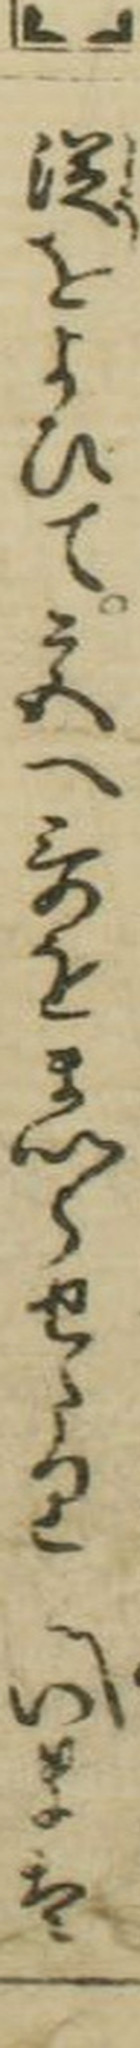従をよひて。宮へ哥をまいらせたり〽いまは
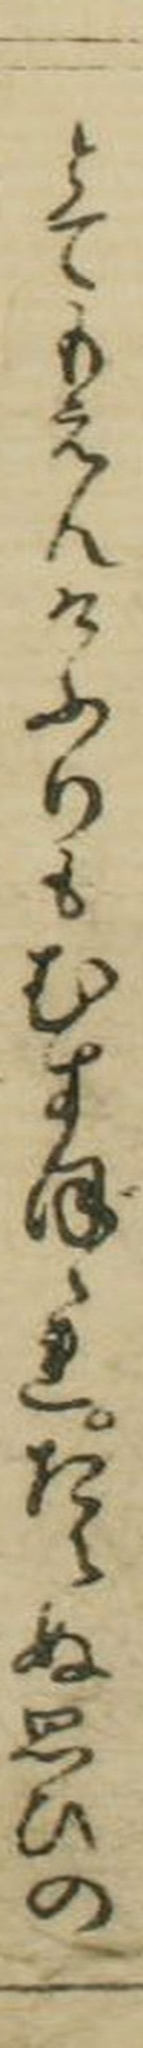とてもえんけふりもむすぼゝれ。たえぬ思ひの
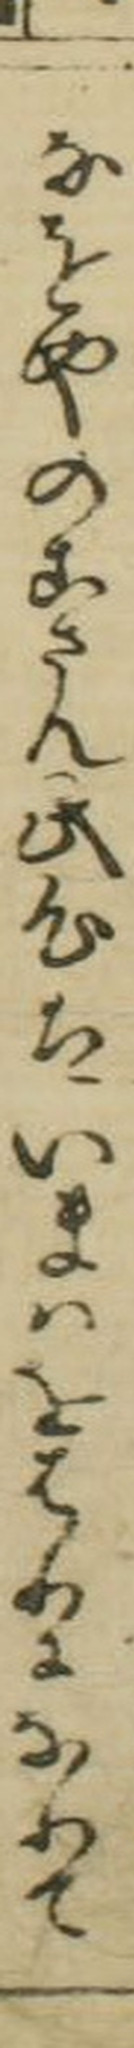なをやのこさん◯此心はいまはをはりになりて
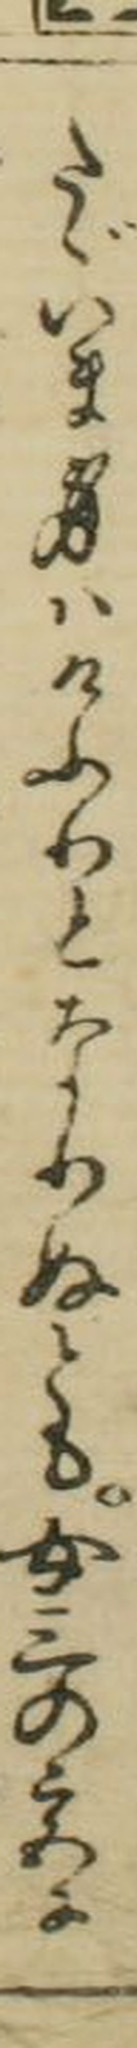たゞいま身はけふりとなりぬとも。女三の宮に
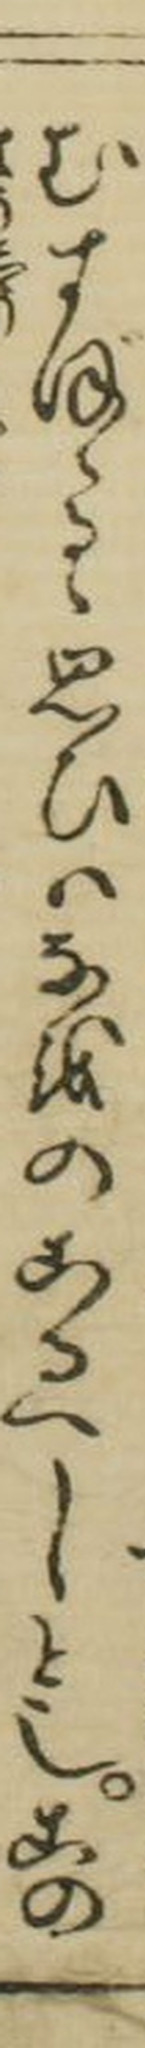むすぼゝるゝ思ひはなをのこるへしと也。この
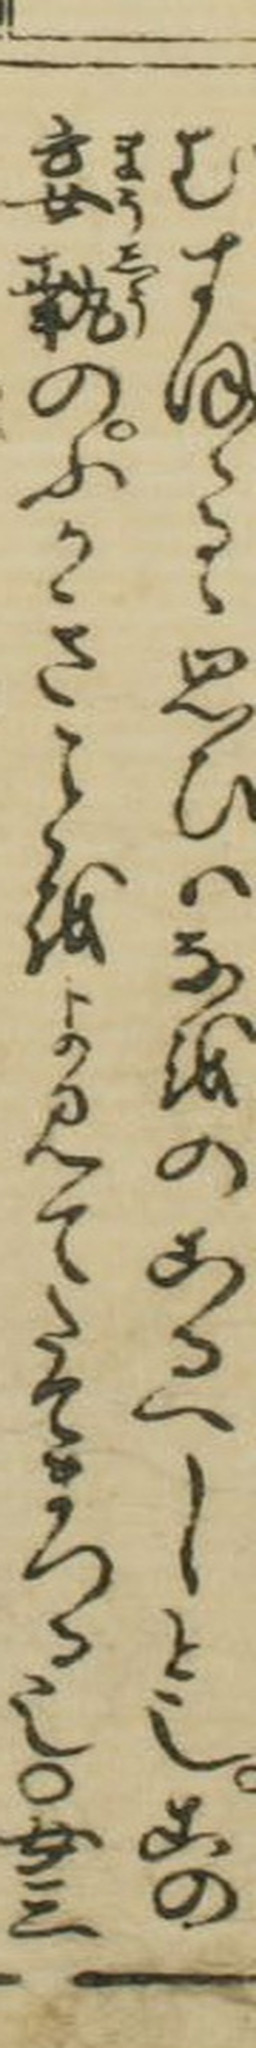妄執の。ふかきことをよみてたてまつる也◯女三
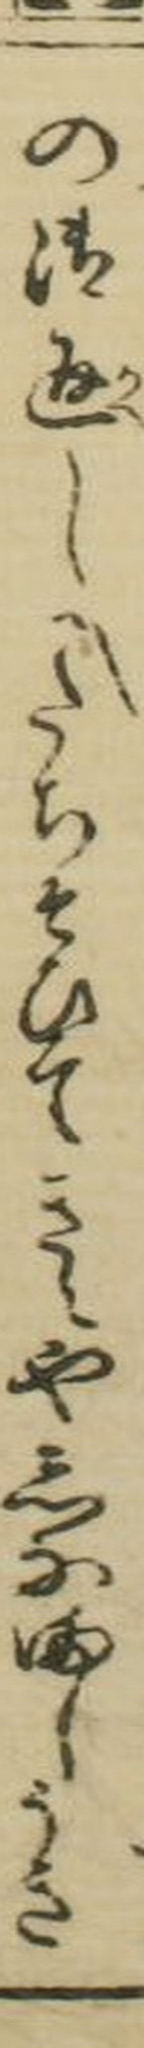の御返し〽たちそひてきえやしなましうき
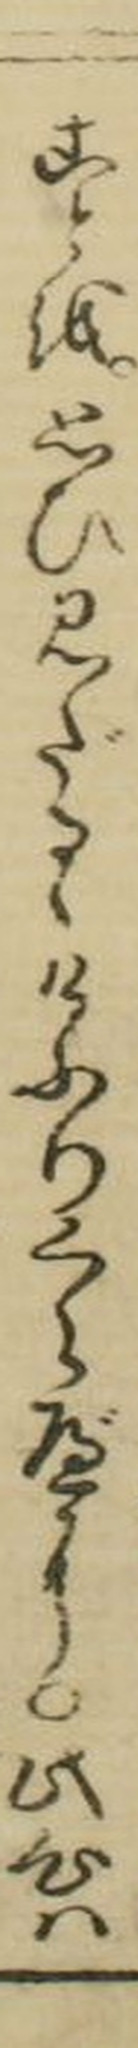ことを。思ひみだるゝけふりくらべに◯此心は
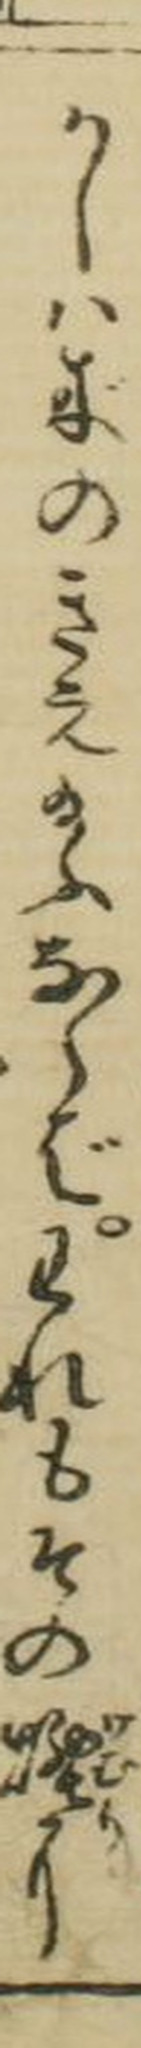かしはぎのきえ給ふならば。われもその煙に
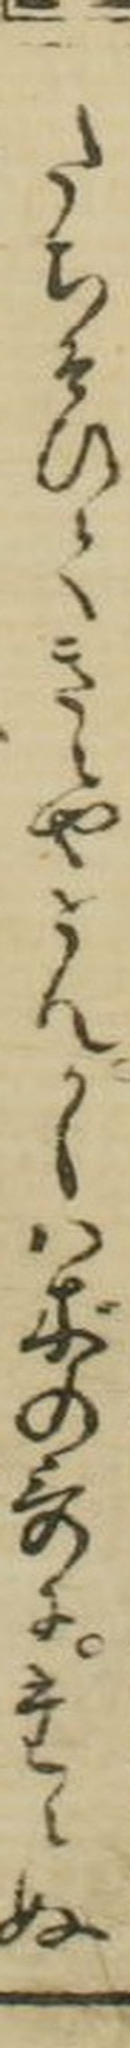たちそひてきえやせん。かしはぎの哥に。たえぬ
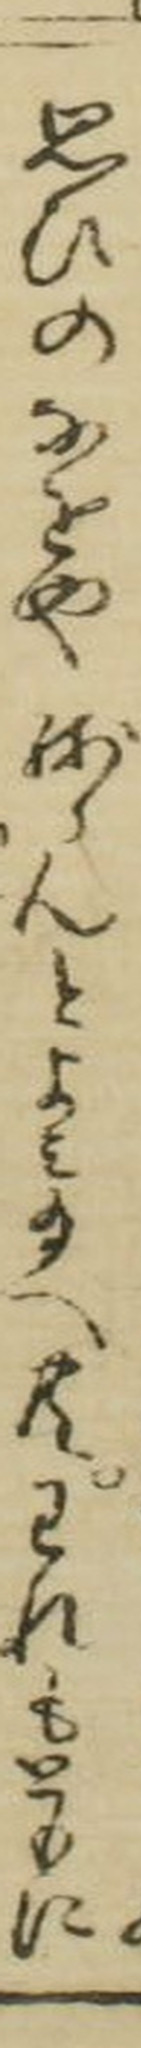思ひのなをや残らんとよみ給へ共。われもともに
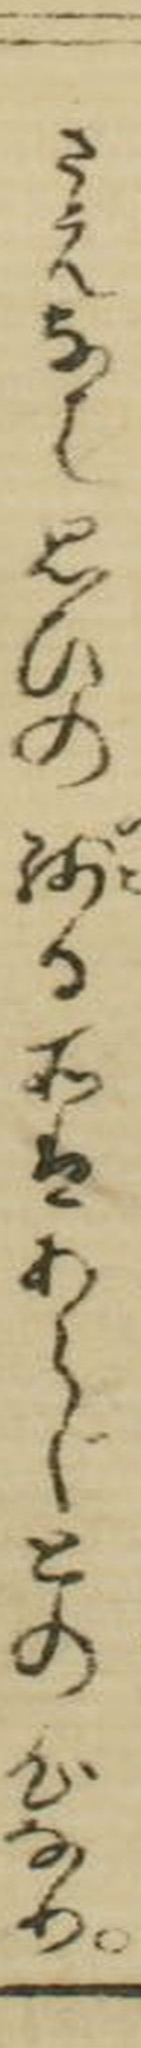きえなは思ひの残る所はあらじとの心なり。
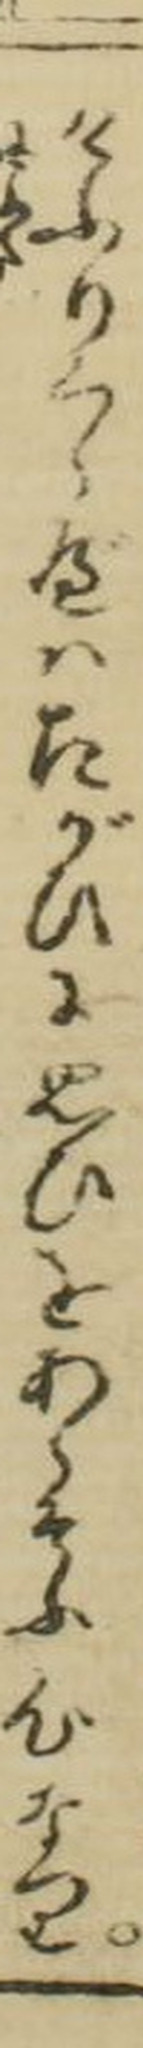けふりくらべはたがひに思ひをあらそふ心なり。
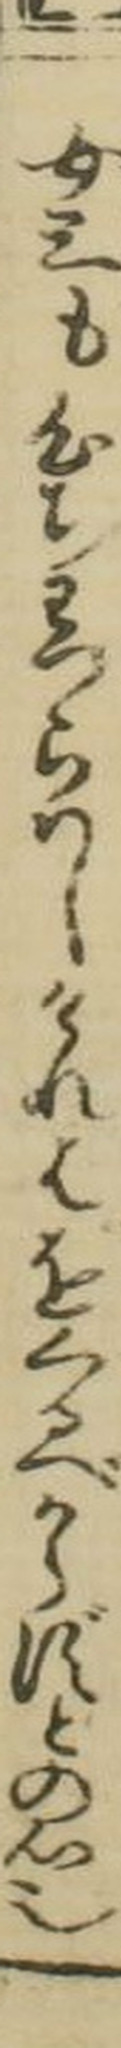女三も心ちわつらはしけれは。をくるべからずとの心也
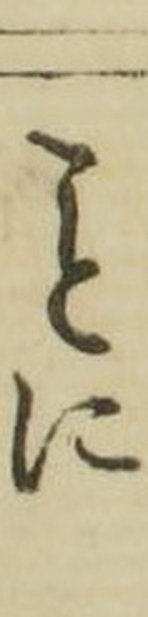ことに
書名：女源氏教訓鑑
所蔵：東京学芸大学附属図書館
